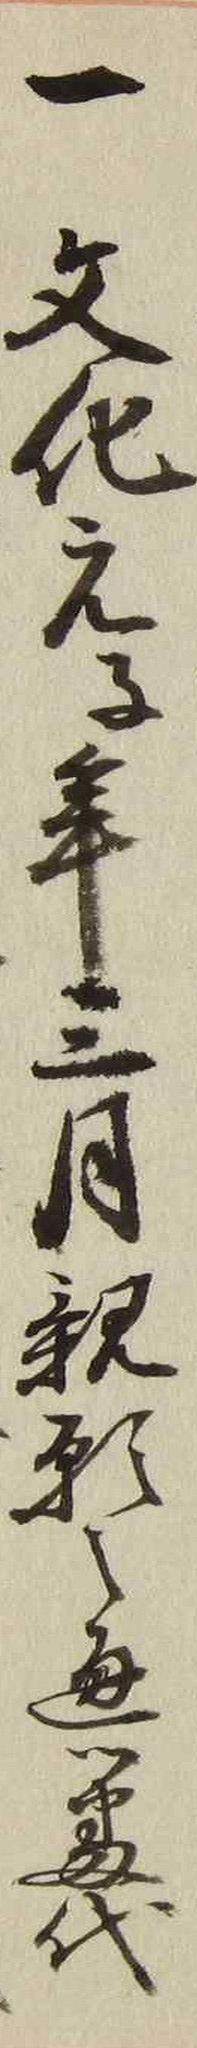一文化元子年三月親願之通御番代
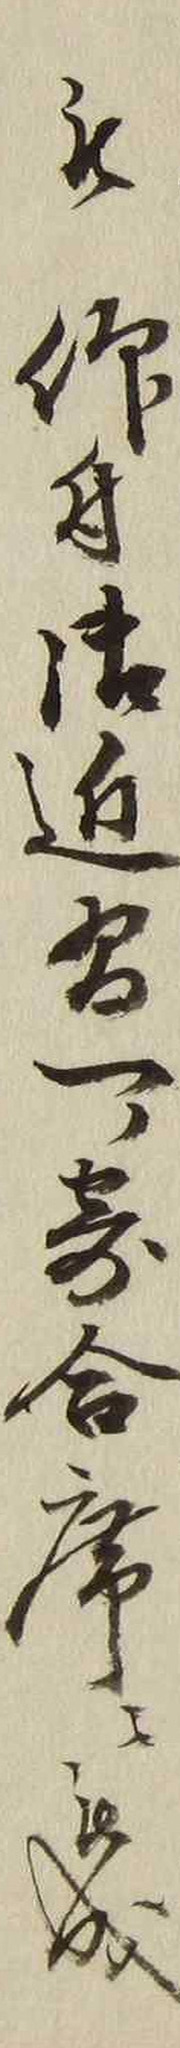被仰付御近習一ノ寄合席ニ被成
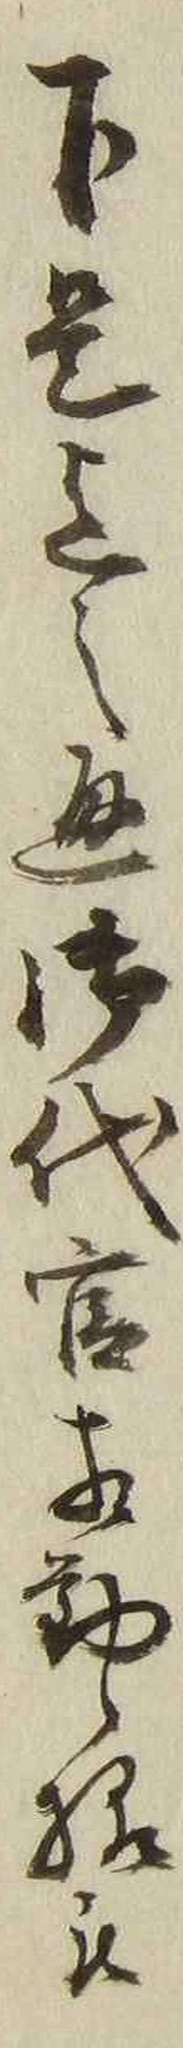下是迄之通御代官相勤候様被

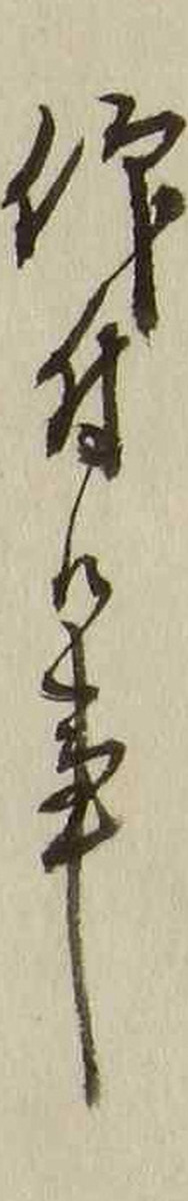仰付候事
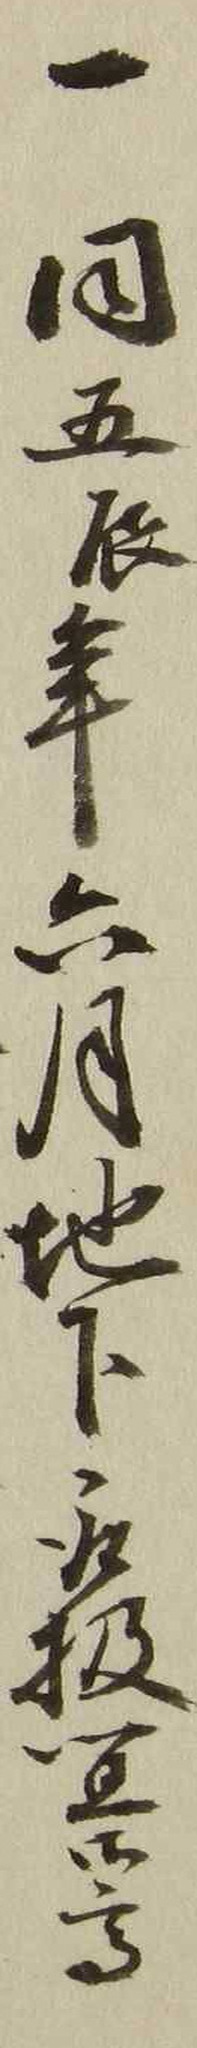一同五辰年六月地下取扱宜御高
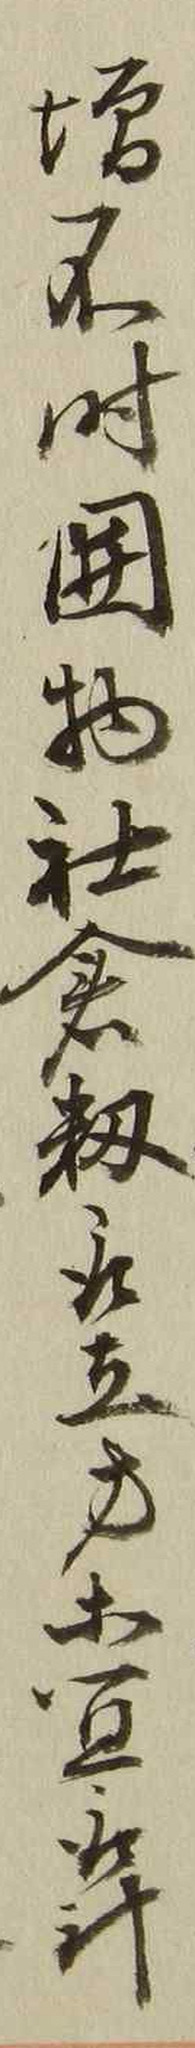増不時囲物社倉籾取立方等宜取計
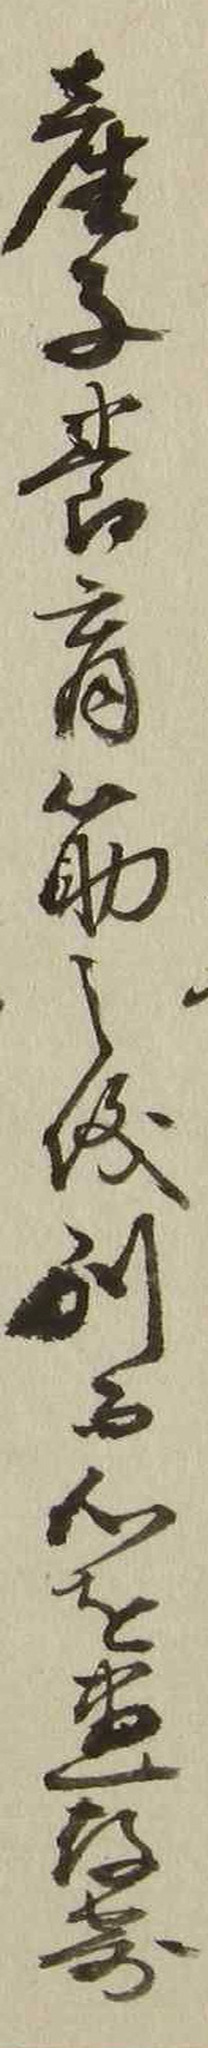産子養育筋之儀別而心を尽存寄
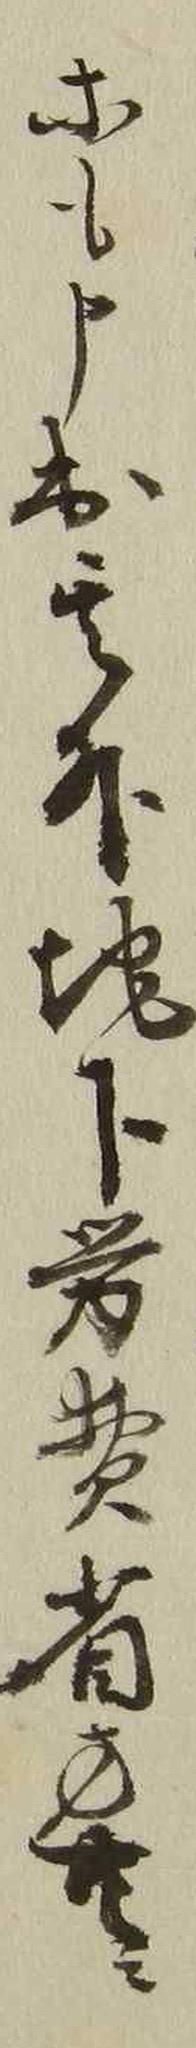等も申出其外地下労費省方共ニ
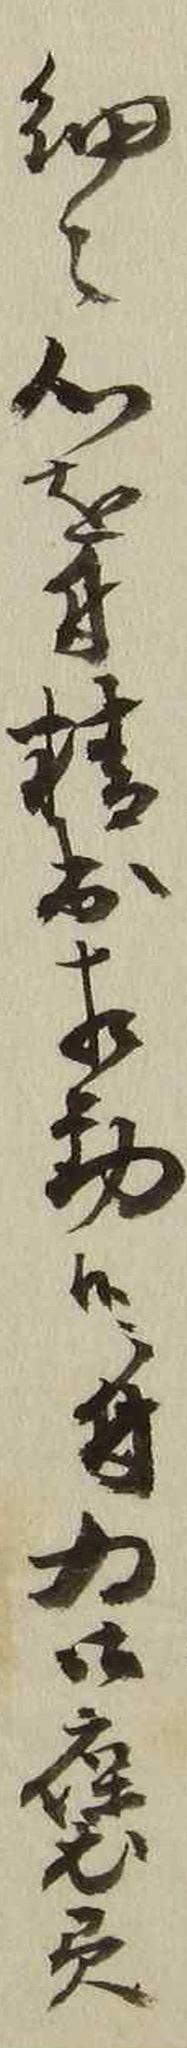細々心を付精出相勤候ニ付為御褒美
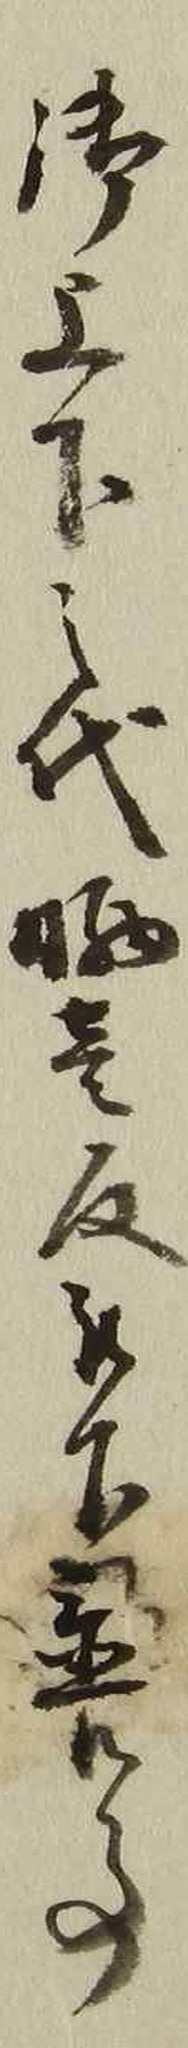御上下之代晒壱反被下置候事
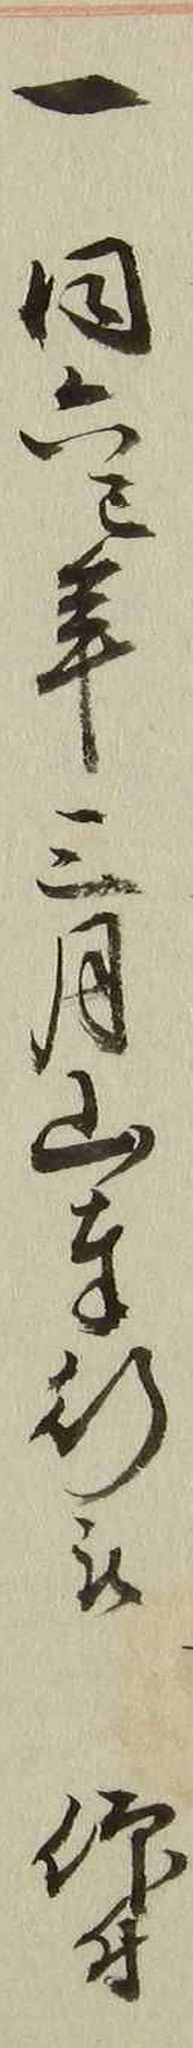一同六巳年三月山奉行被仰付
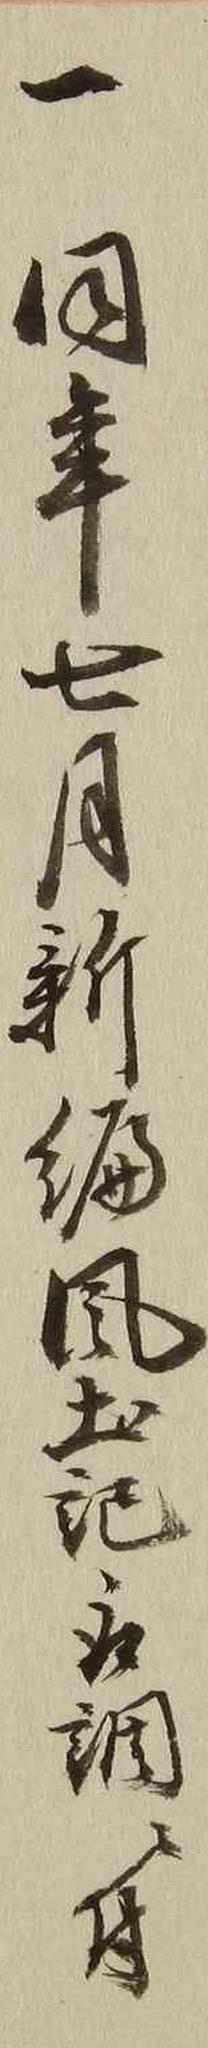一同年七月新編風土記取調ニ付
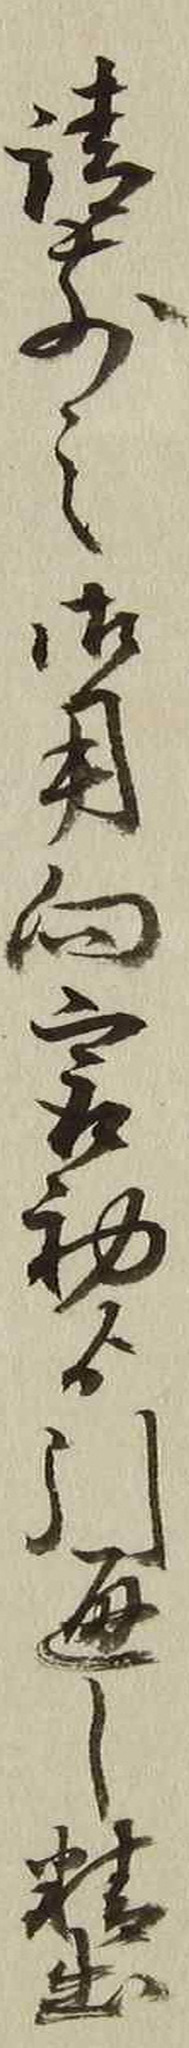請前之御用向最初ゟ引通し精出
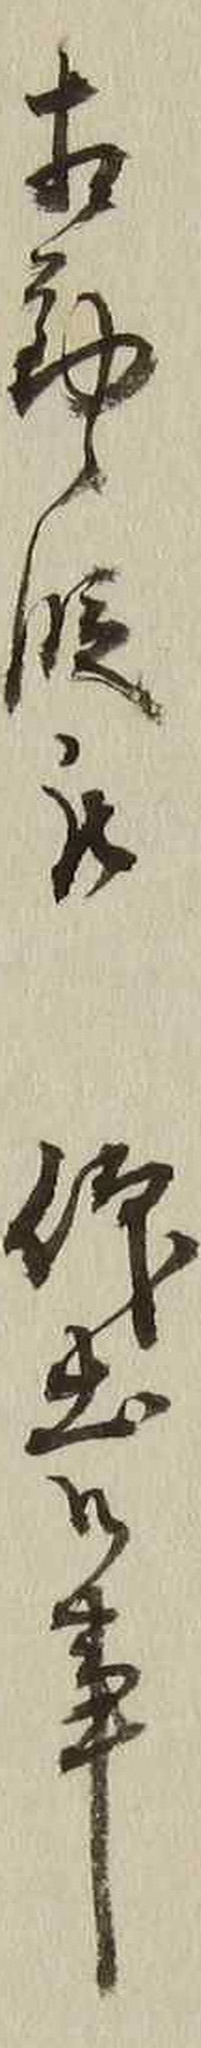相勤候段被仰出候事
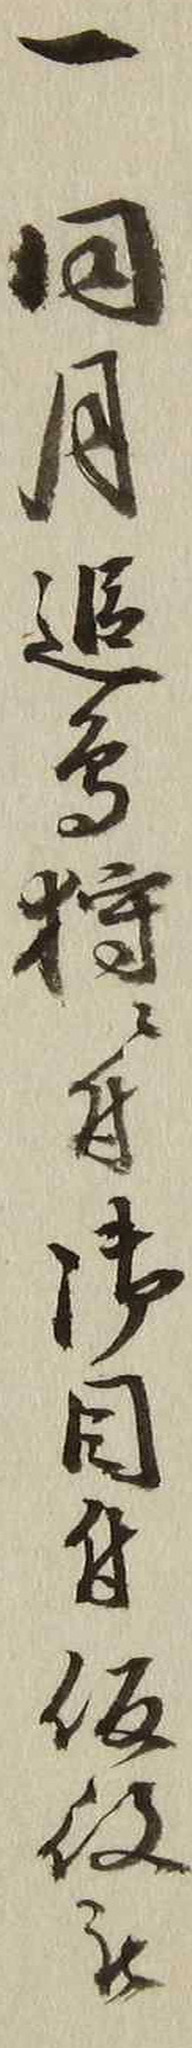一同月追鳥狩ニ付御目付仮役被
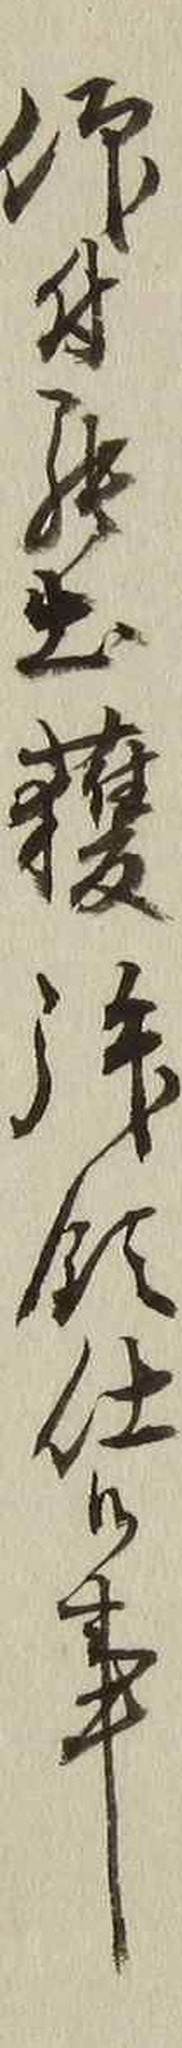仰付罷出獲拝領仕候事
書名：諸士系譜　巻之23　い之部23
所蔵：会津若松市立会津図書館
